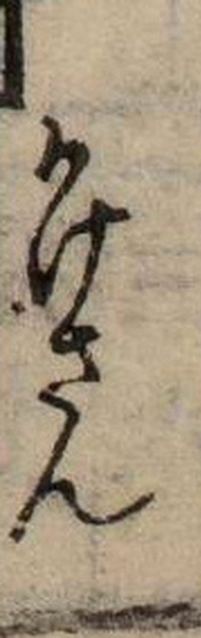かけさん
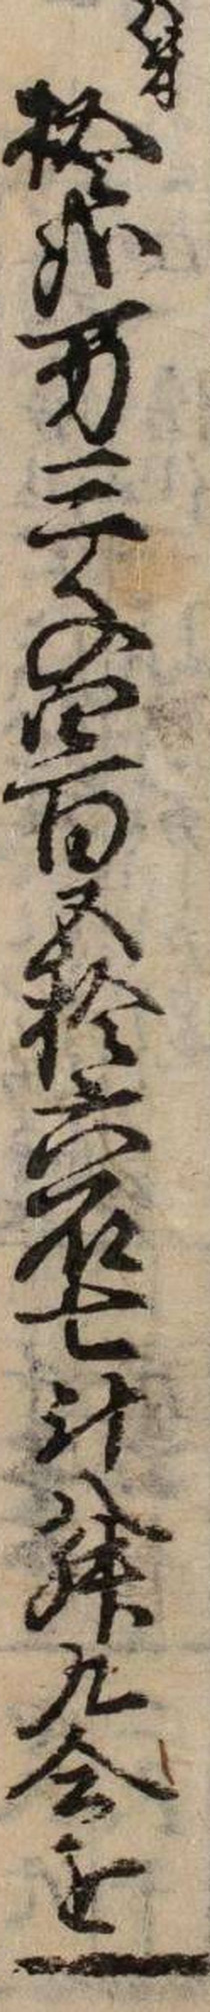あるひは米拾弍万三千四百五十六石七斗八升九合を
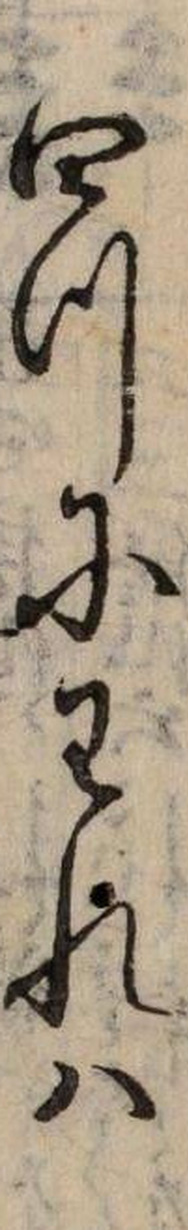四つにわれは
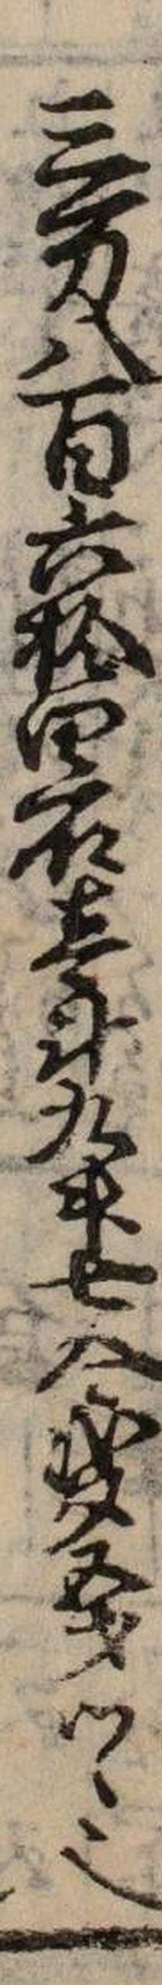三万八百六拾四石壱斗九升七合弍匁五才つ也
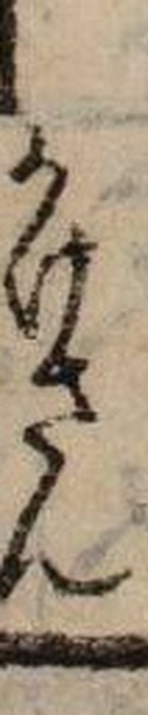かけさん

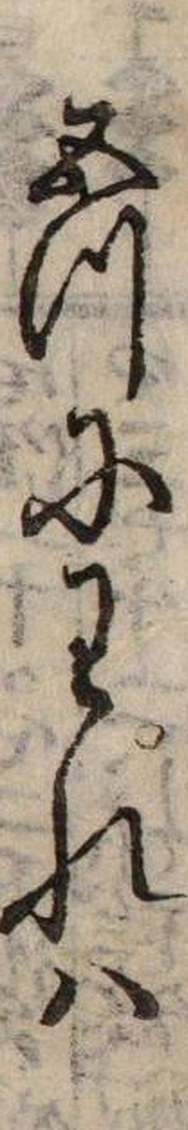五つにわれは
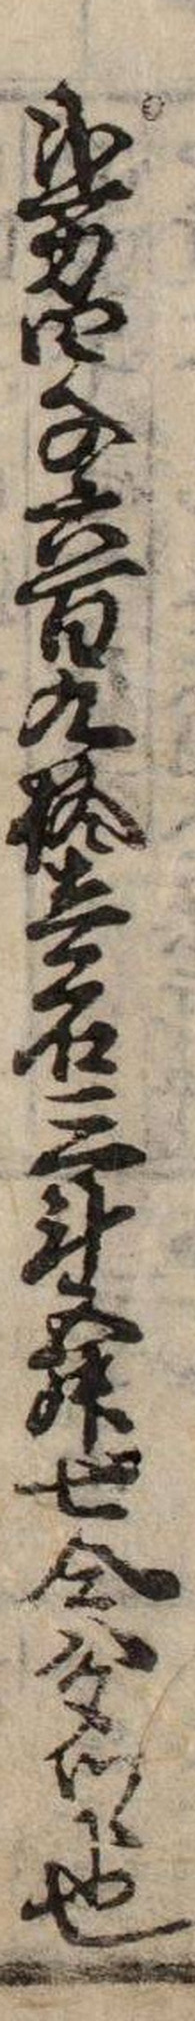弍万四千六百九拾壱石三斗五升七合八匁つゝ也
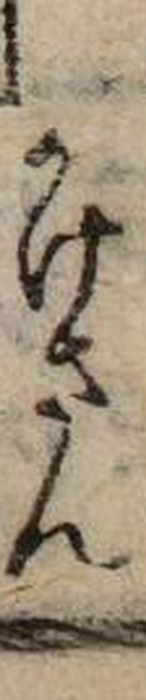かけさん
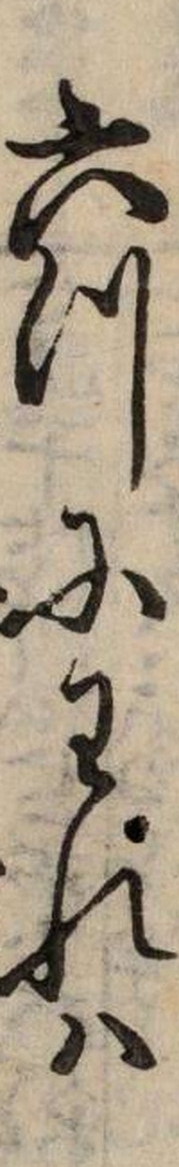六つにわれは
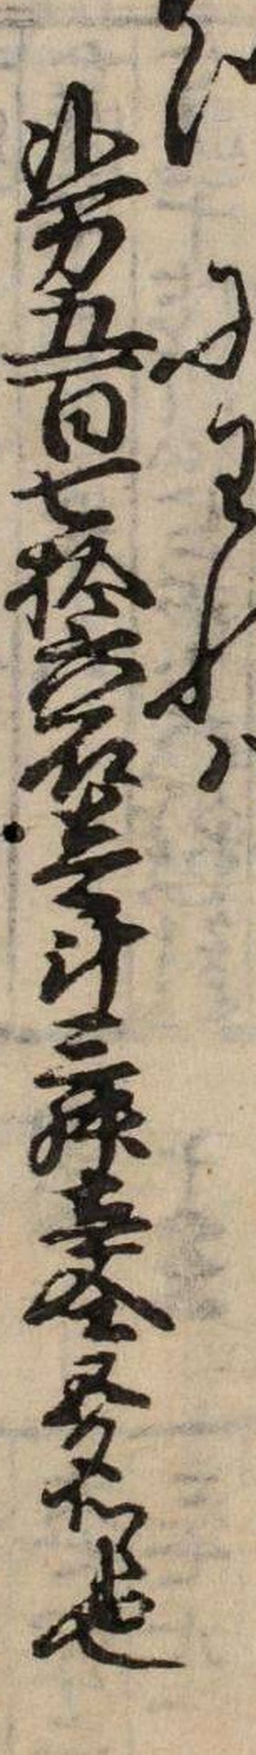弍万五百七拾六石三斗三升壱合五匁つゝ也
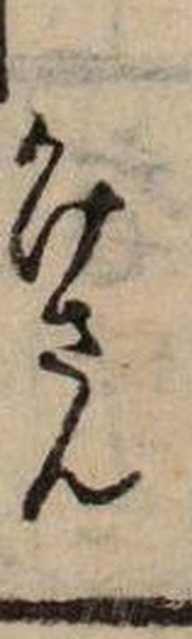かけさん

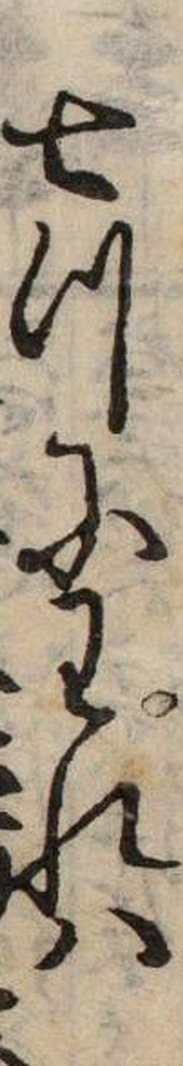七つにわれは
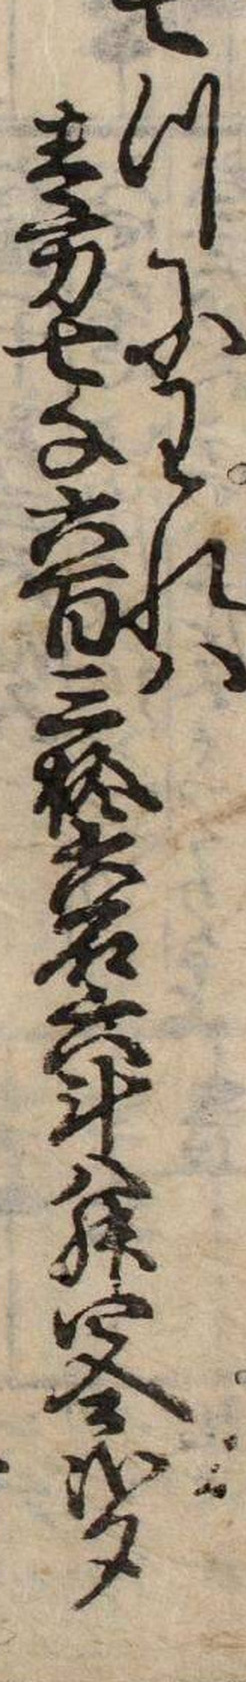壱万七千六百三拾六石六斗八升四合弍匁
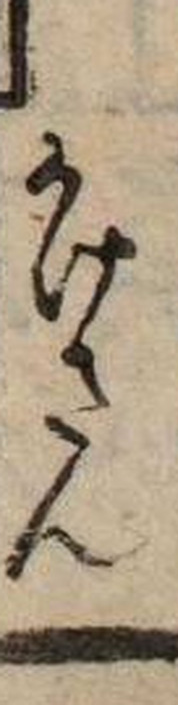かけさん
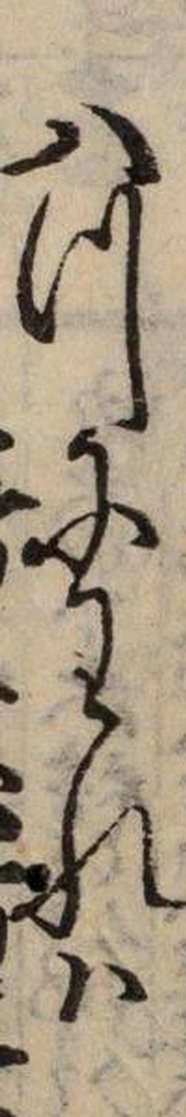八つにわれは
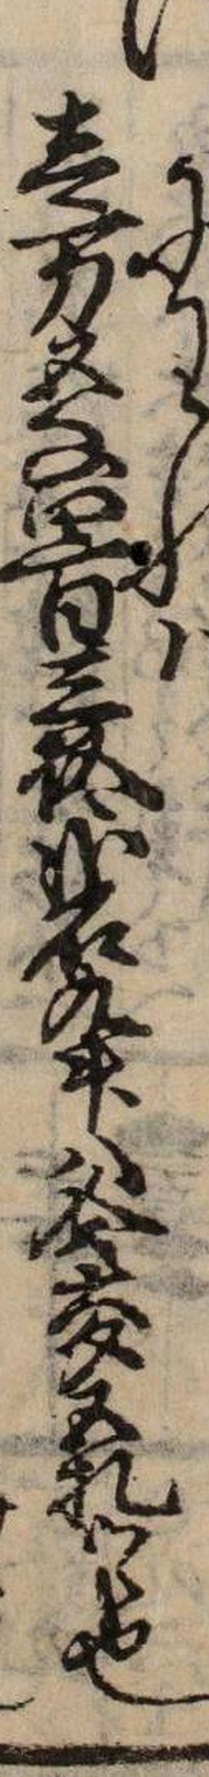一万五千四百三拾弍石九斗八合六匁五札つゝ也
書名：塵劫記（寛永11年自跋、京都府立京都学・歴彩館追貴8）
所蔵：京都府立京都学・歴彩館 国文学研究資料館
